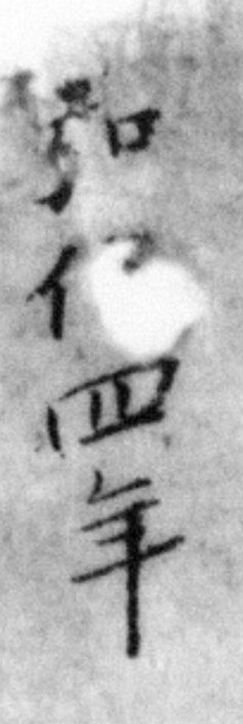弘化四年
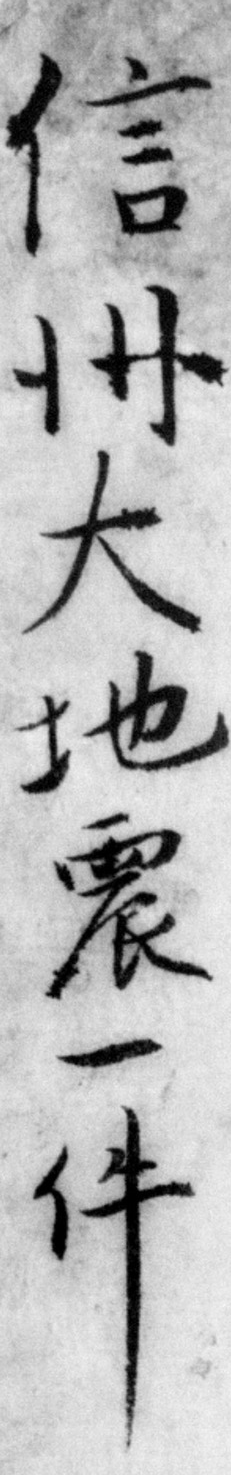信州大地震一件

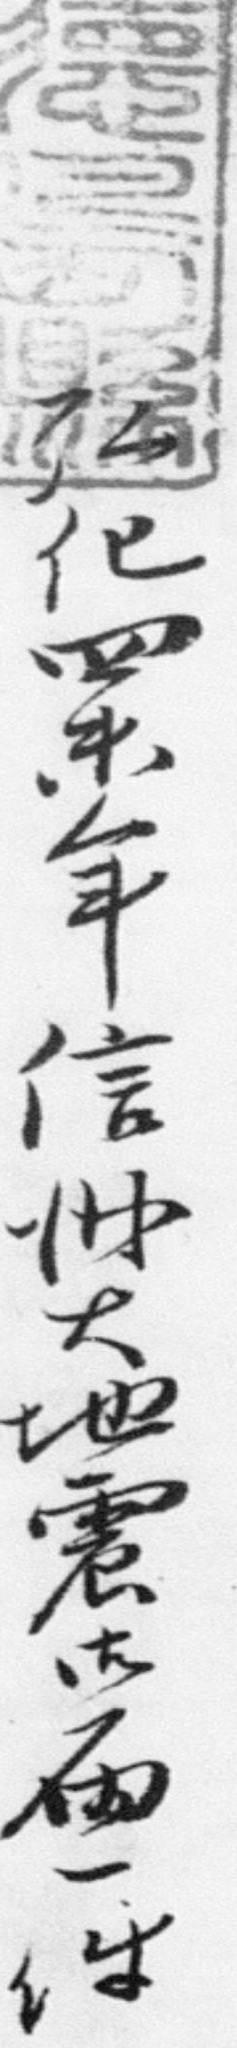弘化四未年信州大地震御届一件
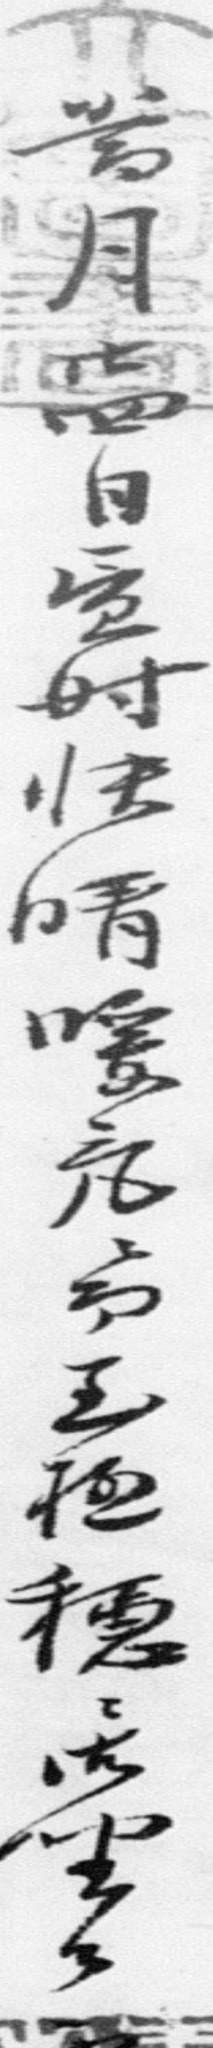当月廿四日昼時快晴暖気に而至極穏に御座候処
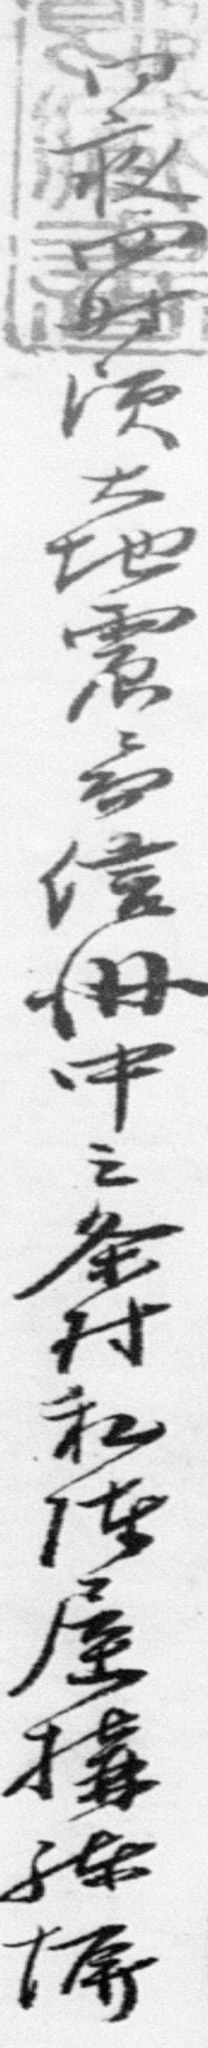同夜四時頃大地震に而信州中之条村私陣屋構練塀
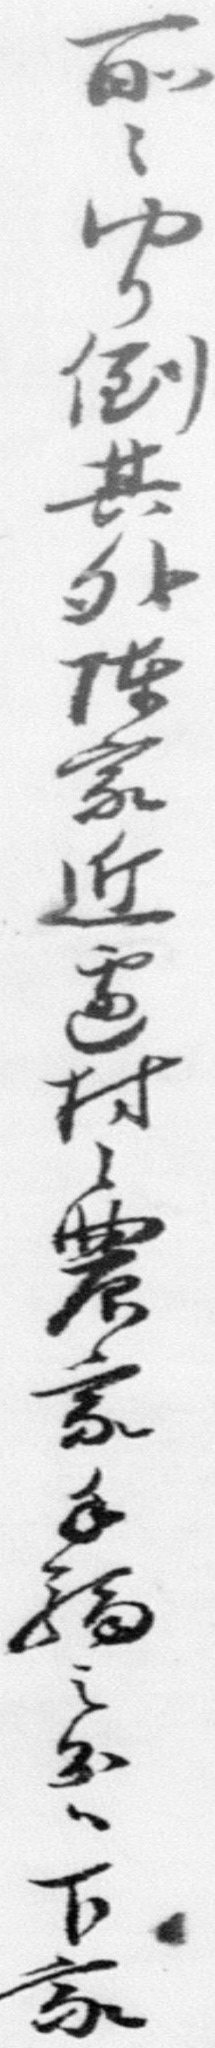所々ゆり倒其外陣家近辺村々農家手弱之分は下家
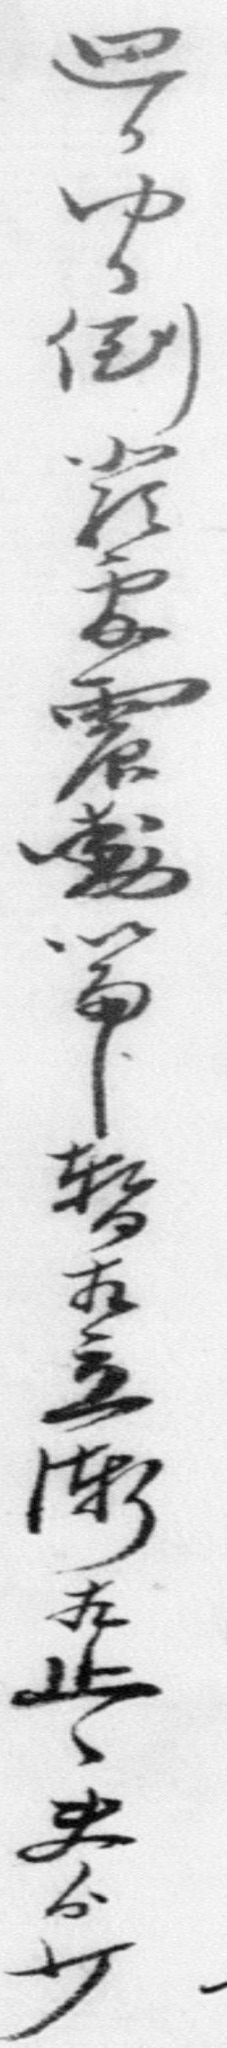廻りゆり倒厳敷震動いたし暫相立漸相止候夫ゟ少
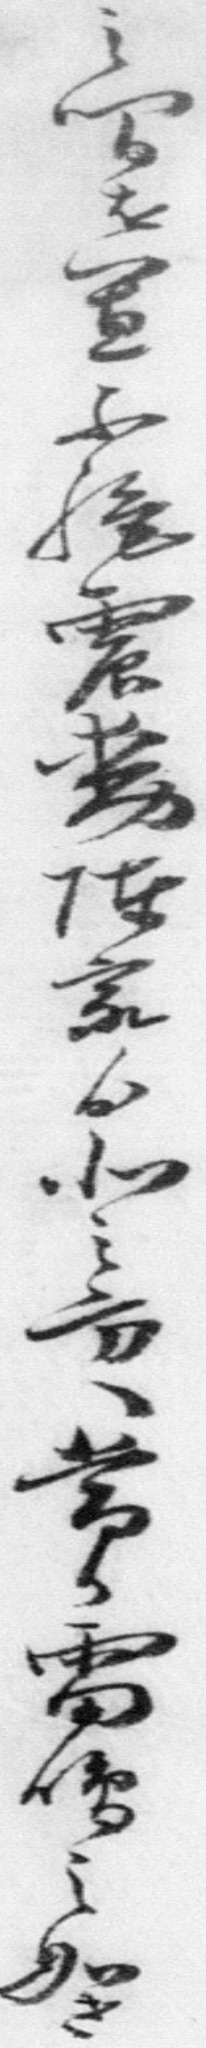之間を置不絶震動陣家ゟ北之方へ当り雷鳴之如き
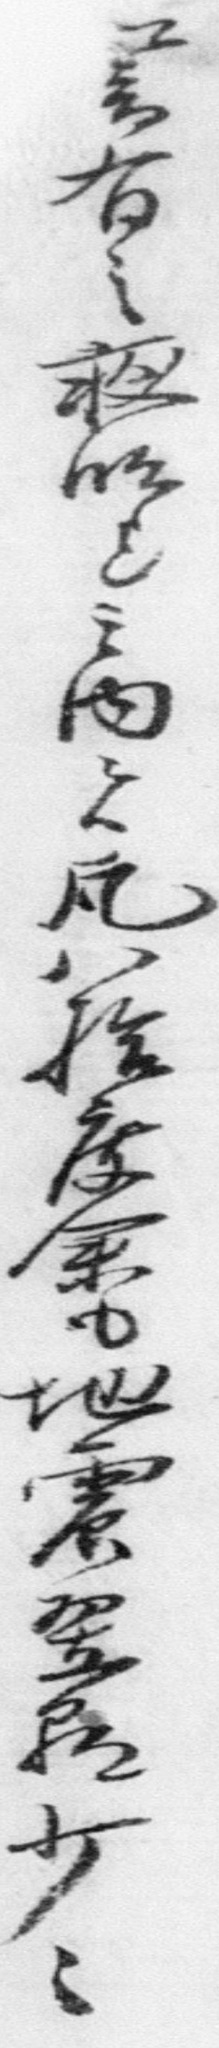響有之夜明迄之内には凡八拾度余も地震翌朝少々
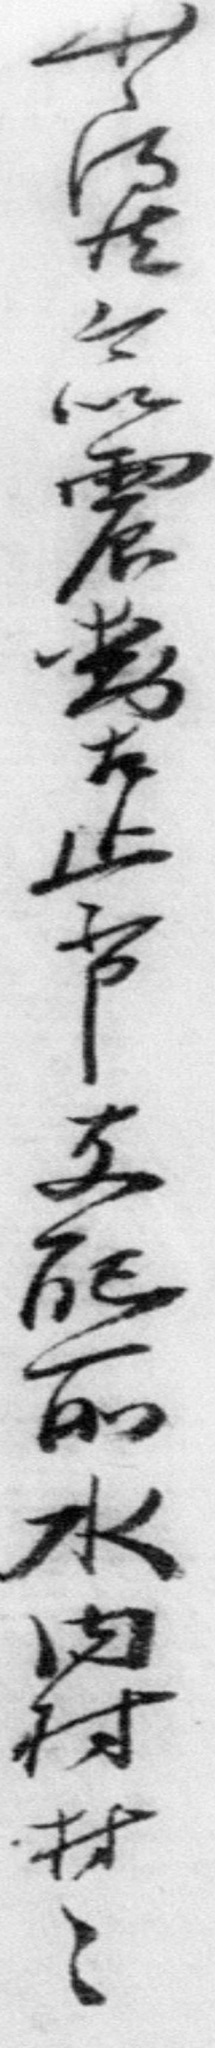候得共今以震動相止不申支配所水内村村々

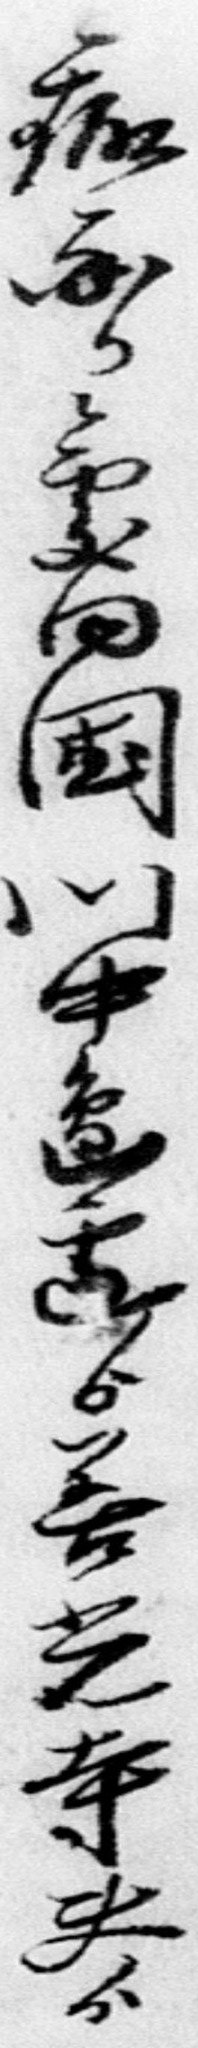趣承り候処同国川中島辺ゟ善光寺夫ゟ
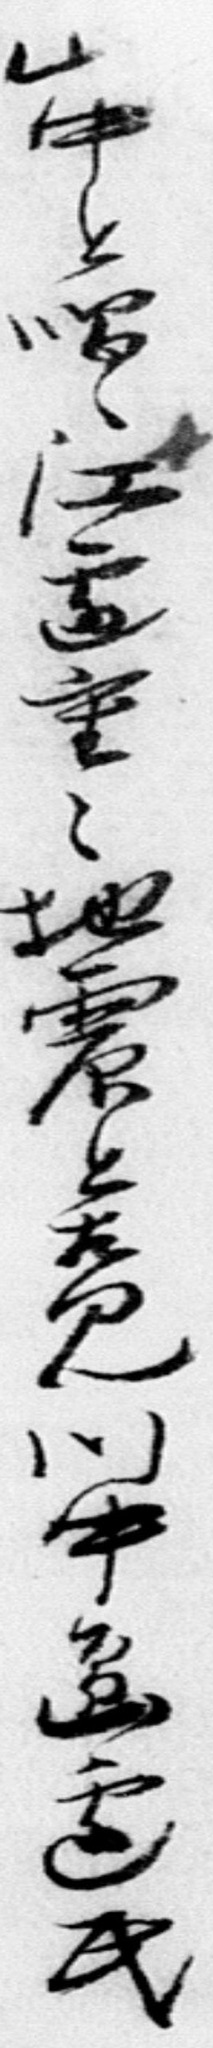山中と唱候江辺重々地震と相見川中島辺民
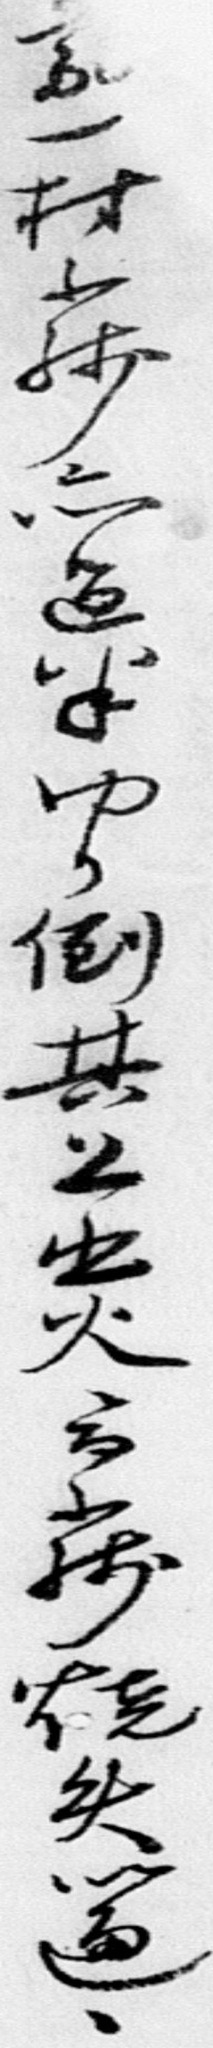一村不残亦過半ゆり倒其上出火に而不残焼失いたし候
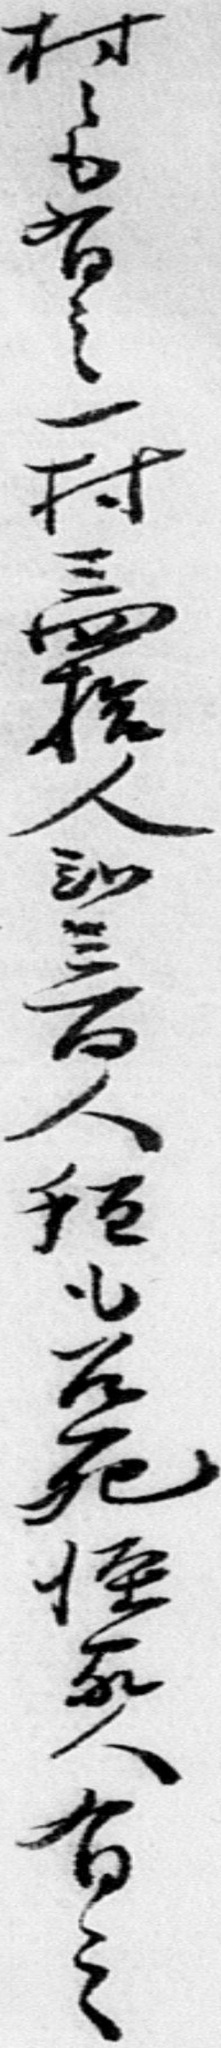村も有之一村三四拾人弐三百人程も即死怪我人有之
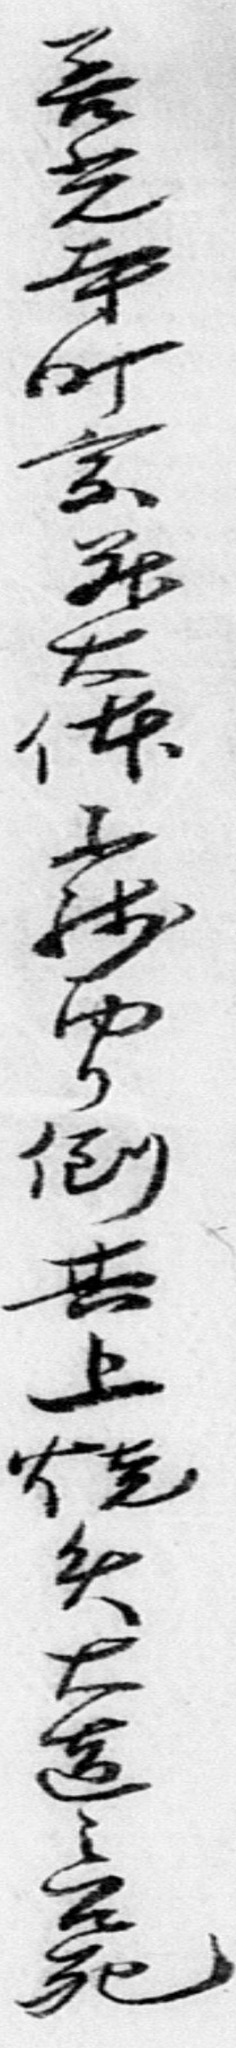善光寺町家並大体不残ゆり倒其上焼失大造の即死
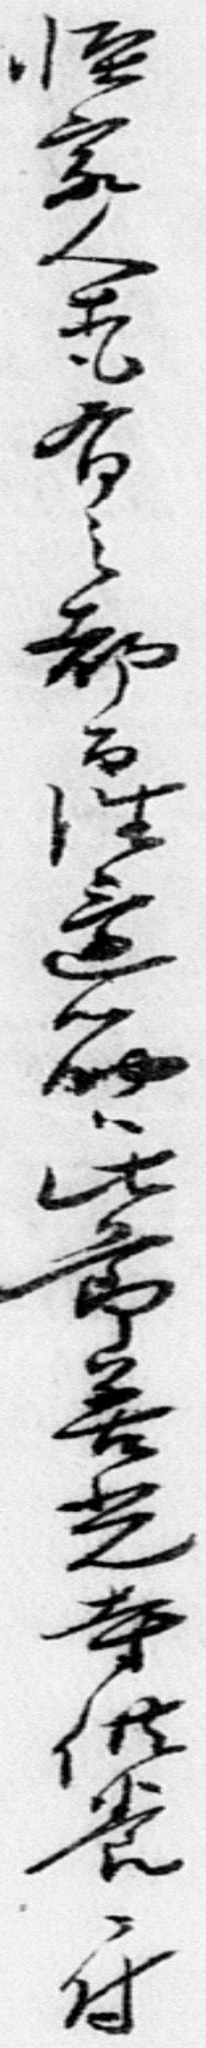怪我人等も有之都而往還筋は此節善光寺供養に付
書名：信州大地震一件
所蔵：徳島県立図書館
